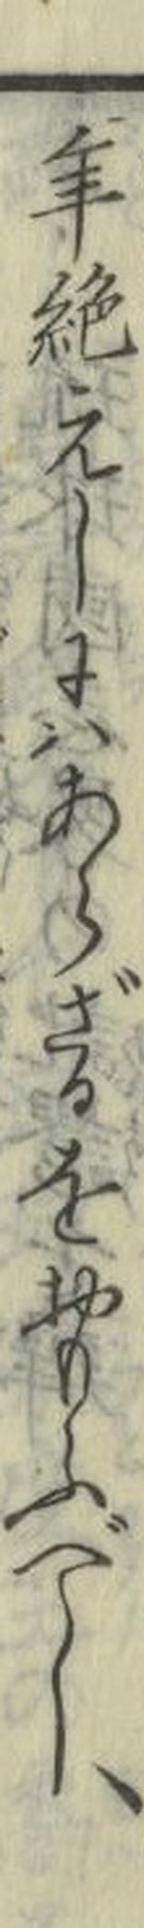年絶えしにはあらざるをおもふべし、
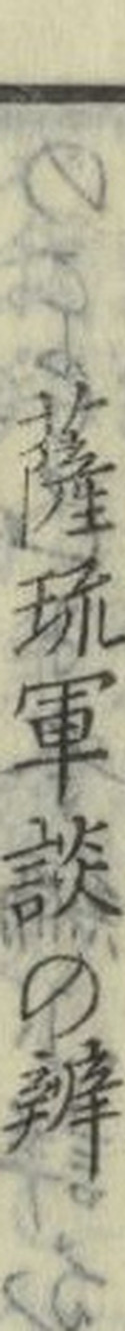薩琉軍談の弁
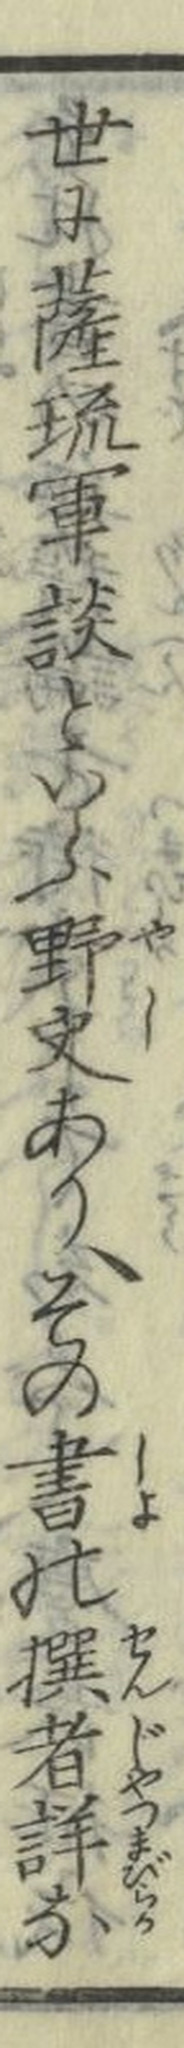世に薩琉軍談といふ野史あり、その書の撰者詳な
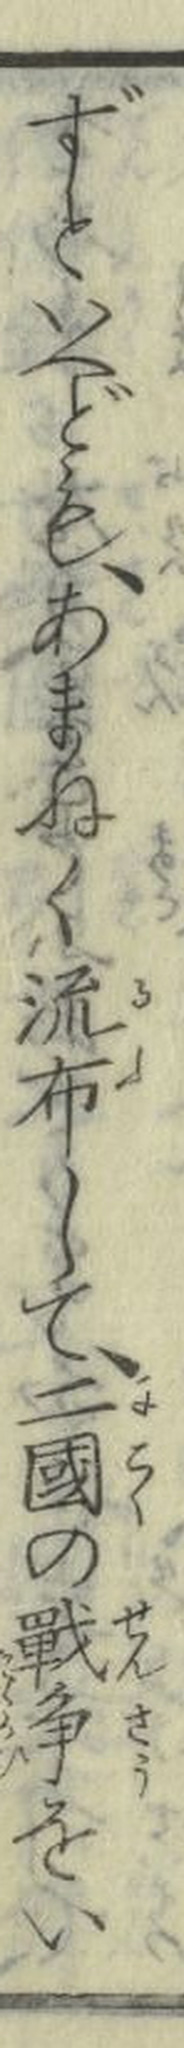ずといへども、あまねく流布して、二国の戦争をい
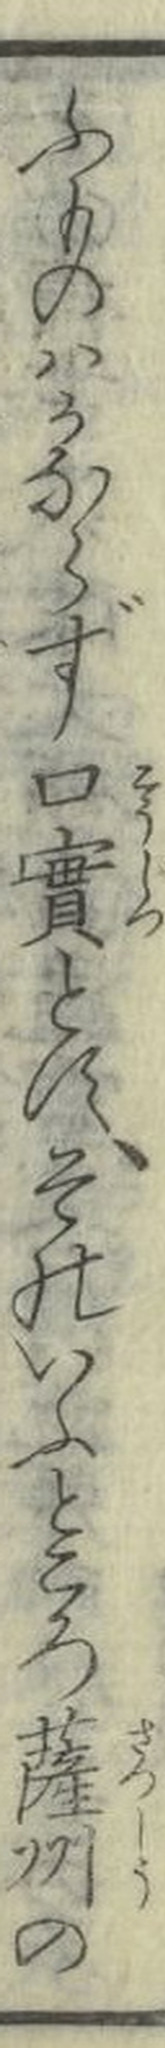ふものはかならず口実とす、そのいふところ、薩州の
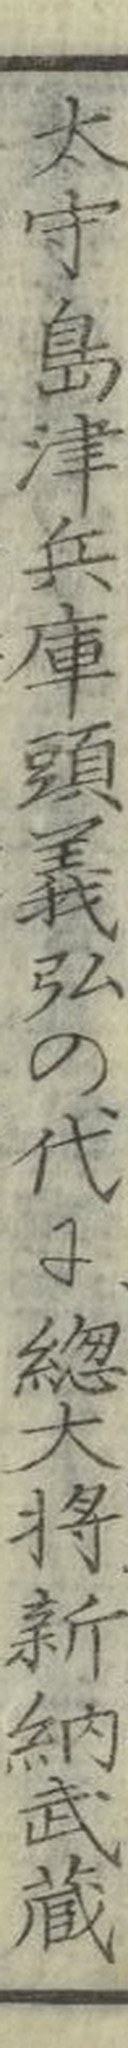太守島津兵庫頭義弘の代に、惣大将新納武蔵
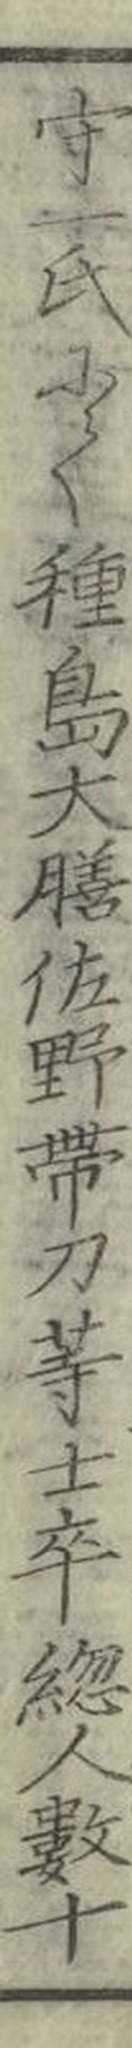守一氏、種島大膳佐野帯刀等、士卒惣人数十

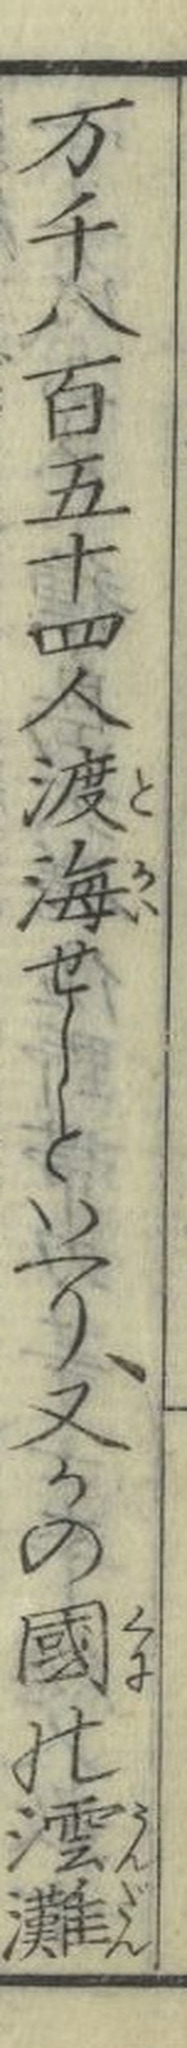万千八百五十四人渡海せしといへり、又かの国の澐灘
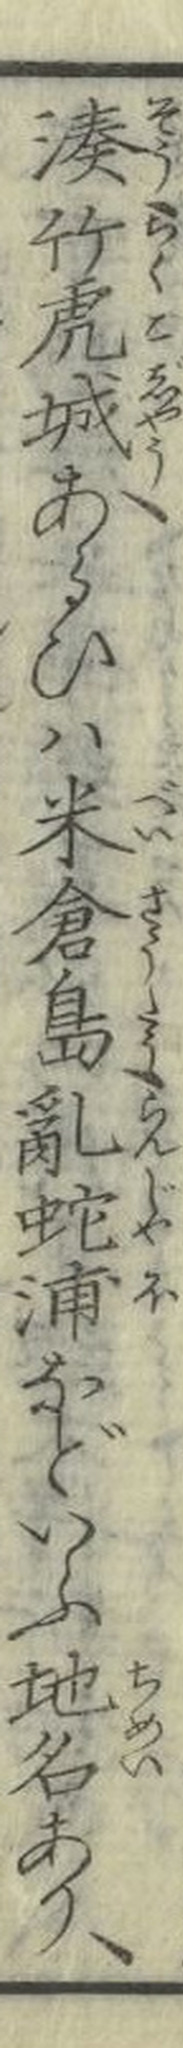湊、竹虎城、あるひは米倉島、乱蛇浦などいふ地名あり、
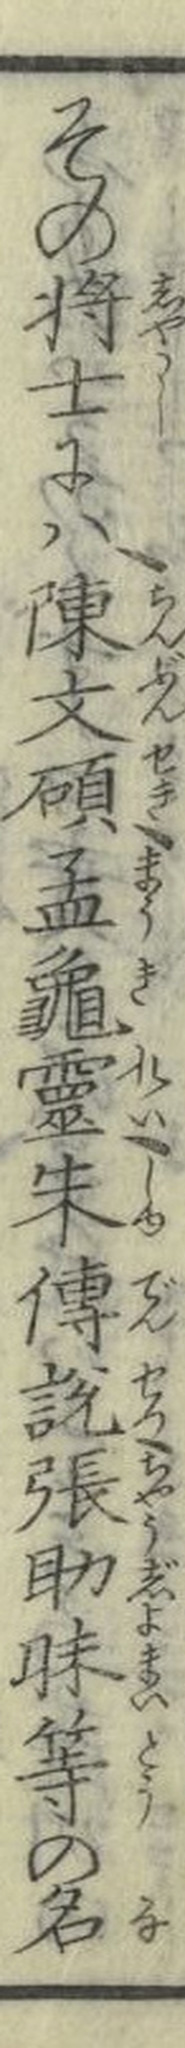その将士には、陳文碩、孟亀霊、朱伝説、張助昧等の名
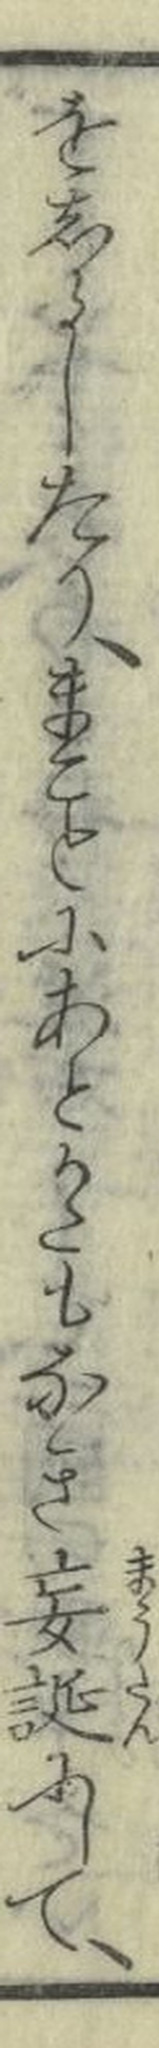をしるしたり、まことにあとかたもなき妄誕にして、
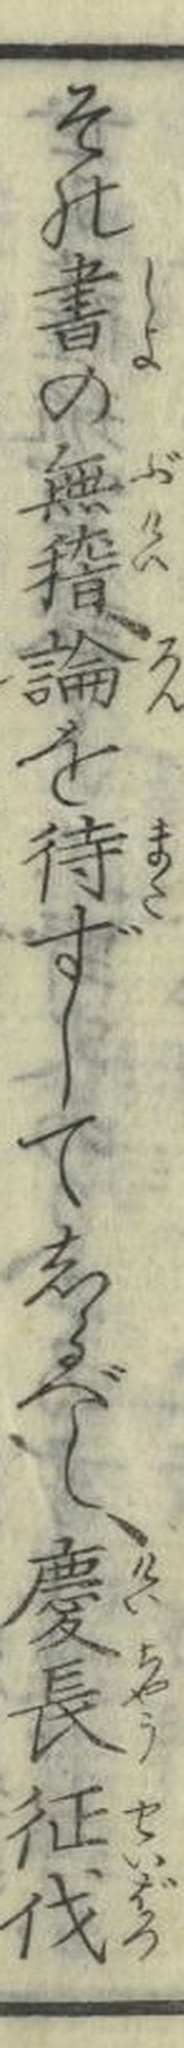その書の無稽、論を待ずしてしるべし、慶長征伐
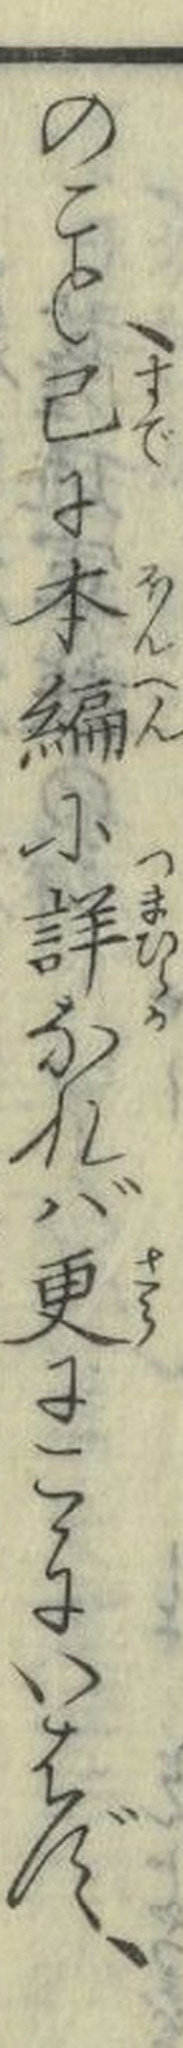のこと、已に本編に詳なれば更にこゝにいはず、
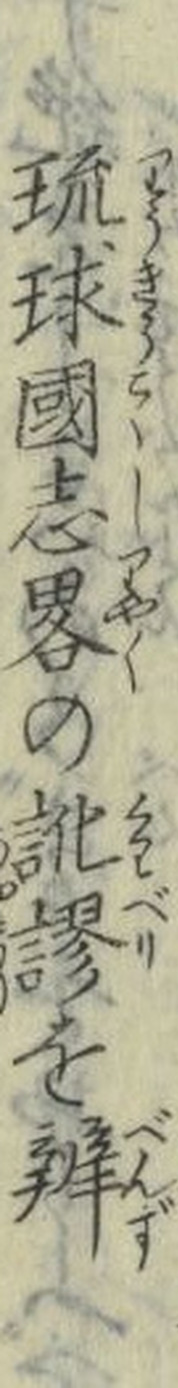琉球国志略の訛謬を弁
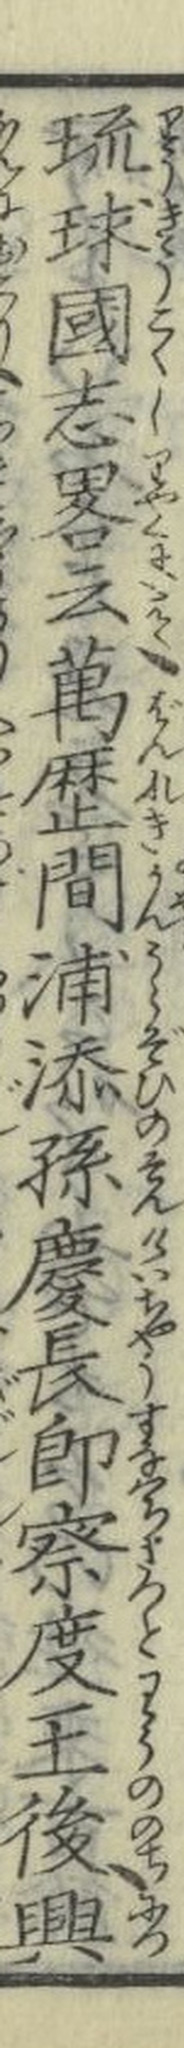琉球国志略云、万歴間浦添孫慶長即察度王後、興
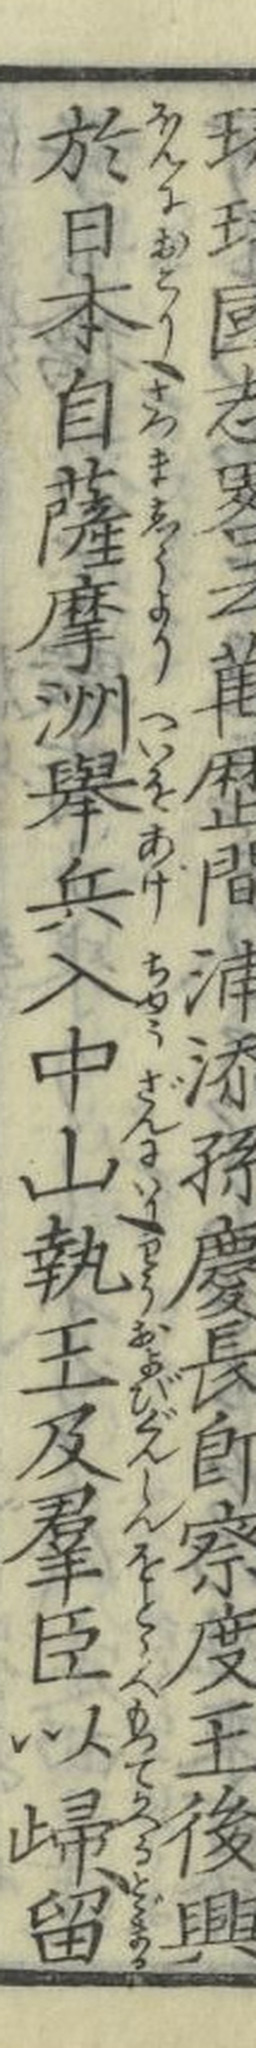於日本、自薩摩州挙兵入中山、執王及群臣以帰、留
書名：琉球入貢紀畧
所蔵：University of the Ryukyus Library
